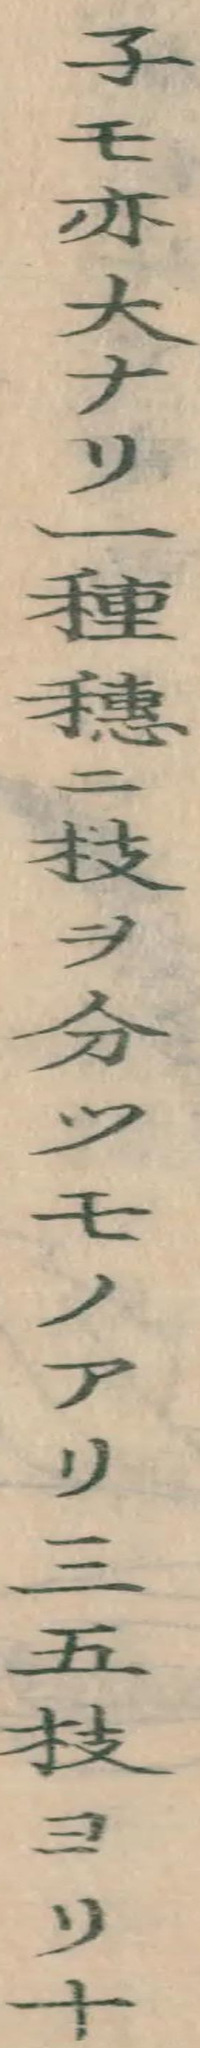子モ亦大ナリ一種穂ニ枝ヲ分ツモノアリ三五枝ヨリ十
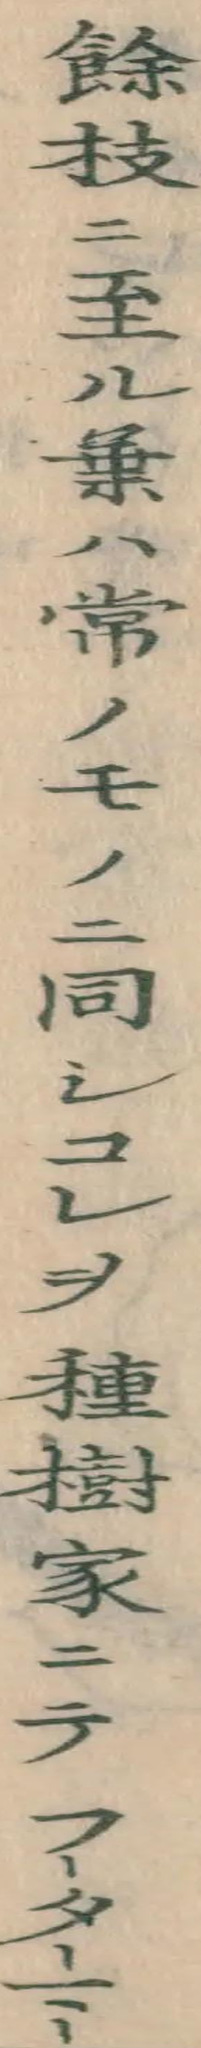余枝ニ至ル葉ハ常ノモノニ同シコレヲ種樹家ニテフ-タ-マ-
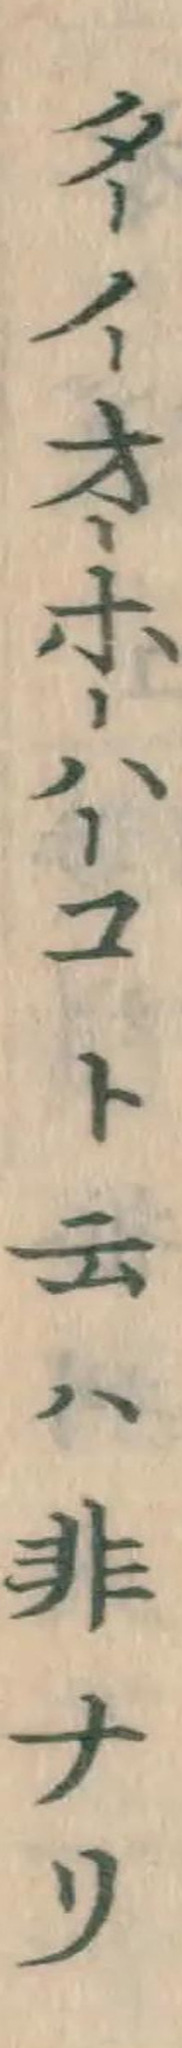タ-ノ-オ-ホ-ハ-コト云ハ非ナリ
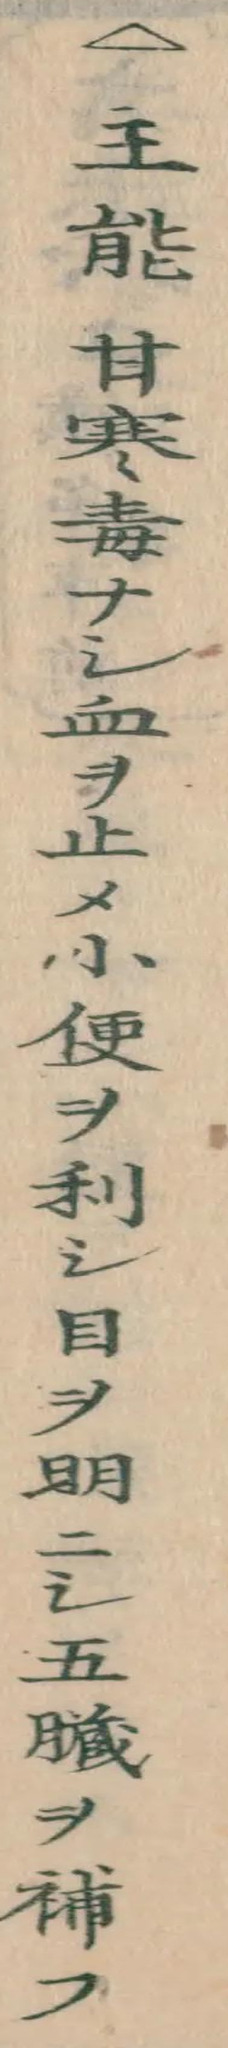△主能甘寒毒ナシ血ヲ止メ小便ヲ利シ目ヲ明ニシ五臓ヲ補フ

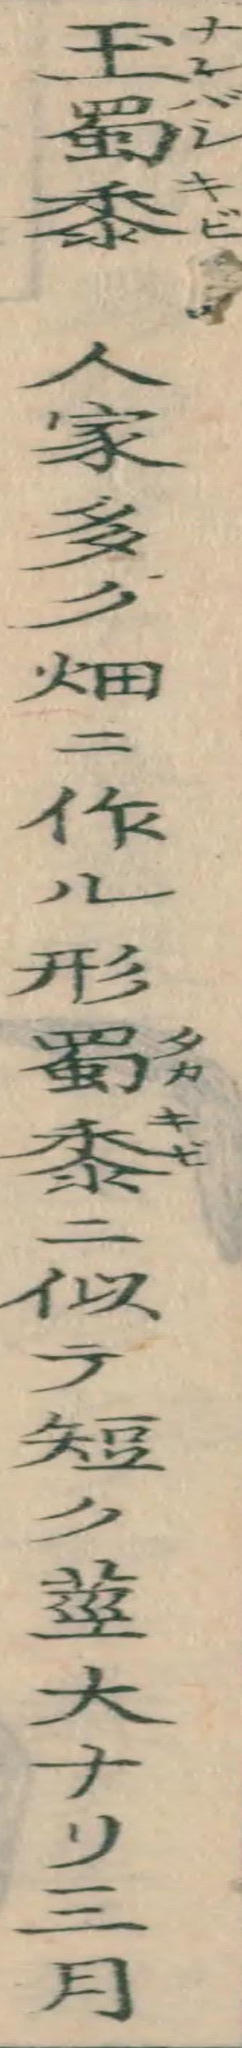玊蜀黍人家多ク畑ニ作ル形蜀黍ニ似テ短ク茎大ナリ三月
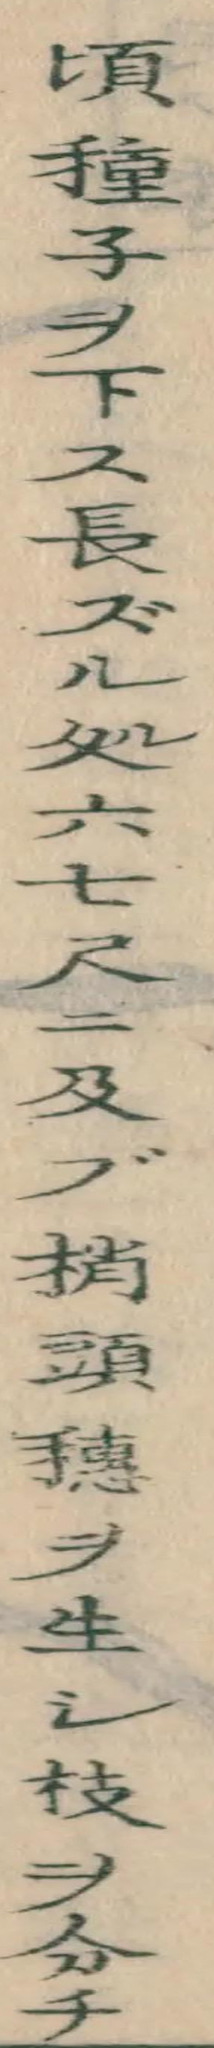頃種子ヲ下ス長ズル処六七尺ニ及ブ梢頭穂ヲ生シ枝ヲ分チ
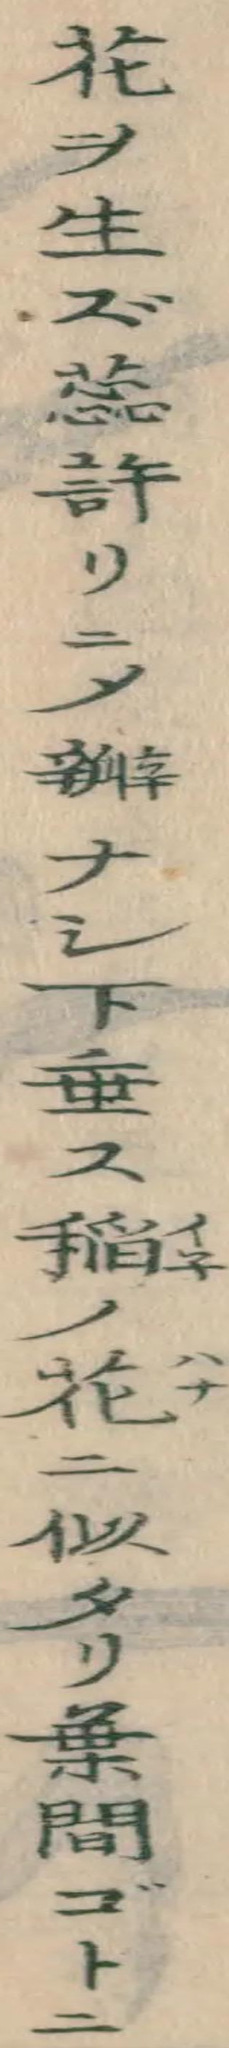花ヲ生ズ蕊許リニシテ弁ナシ下垂ス稲ノ花ニ似タリ葉間ゴトニ
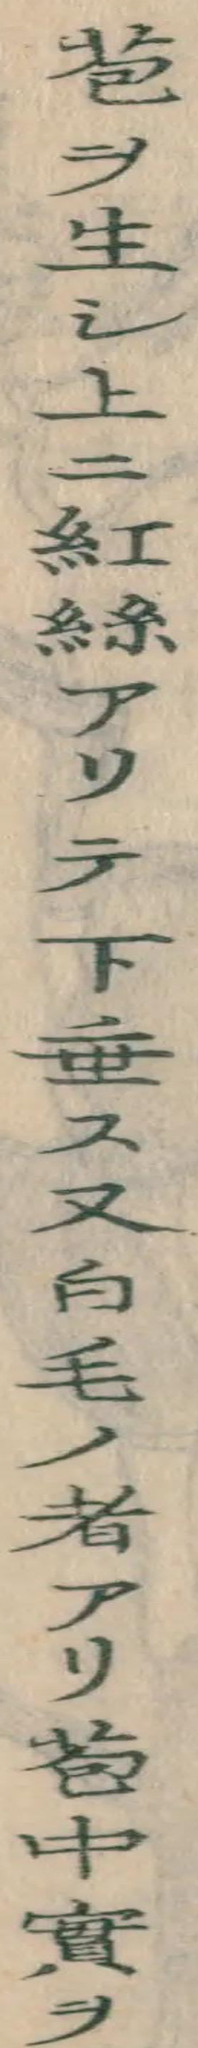苞ヲ生シ上ニ紅糸アリテ下垂ス又白毛ノ者アリ苞中実ヲ
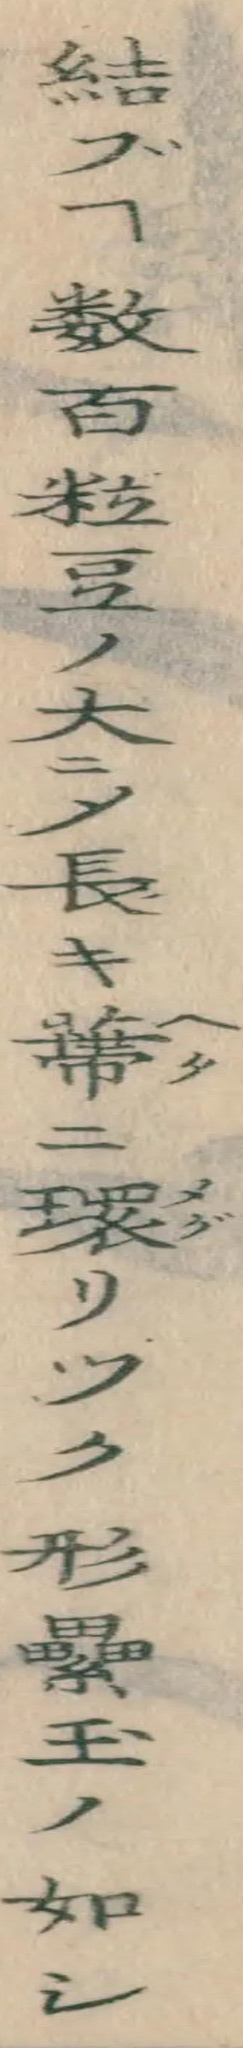結ブコト数百粒豆ノ大ニシテ長キ蒂ニ環リツク形纍玉ノ如シ
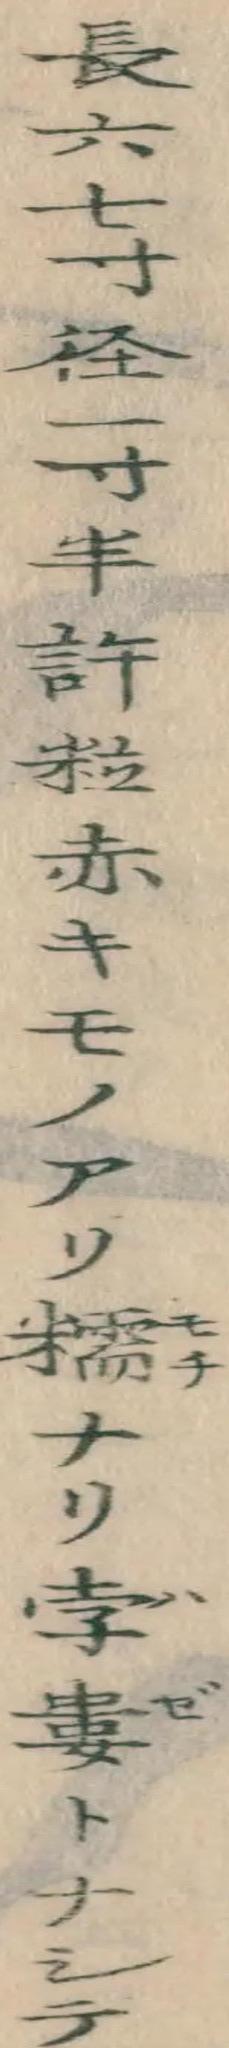長六七寸径一寸半許粒赤キモノアリ糯ナリ孛婁トナシテ
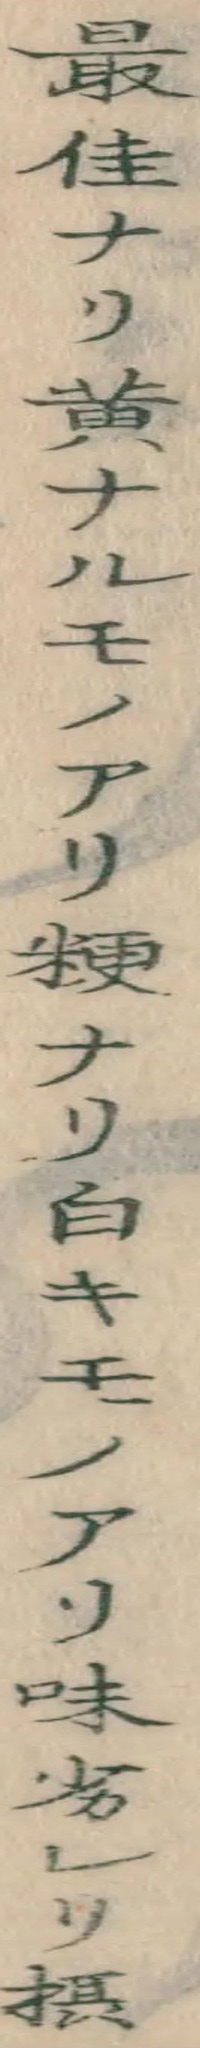最佳ナリ黄ナルモノアリ粳ナリ白キモノアリ味劣レリ摂
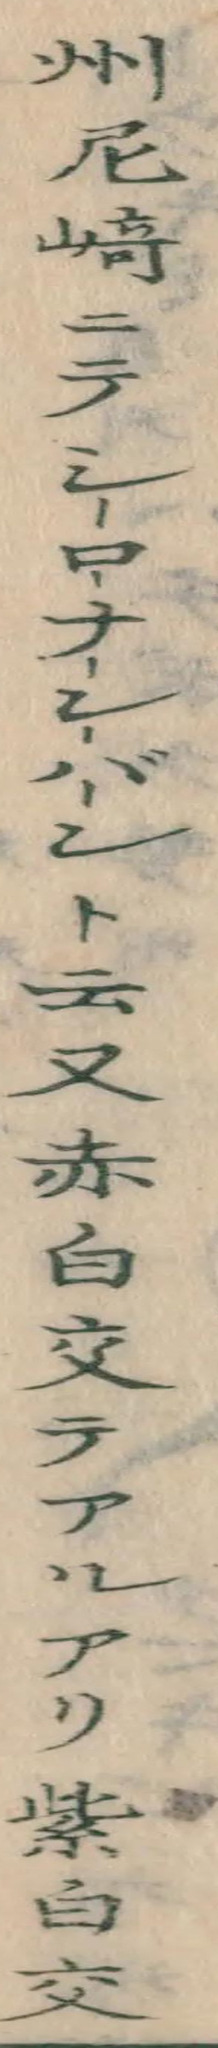州尼崎ニテシ-ロ-ナ-ン-バ-ント云又赤白交テアルアリ紫白交
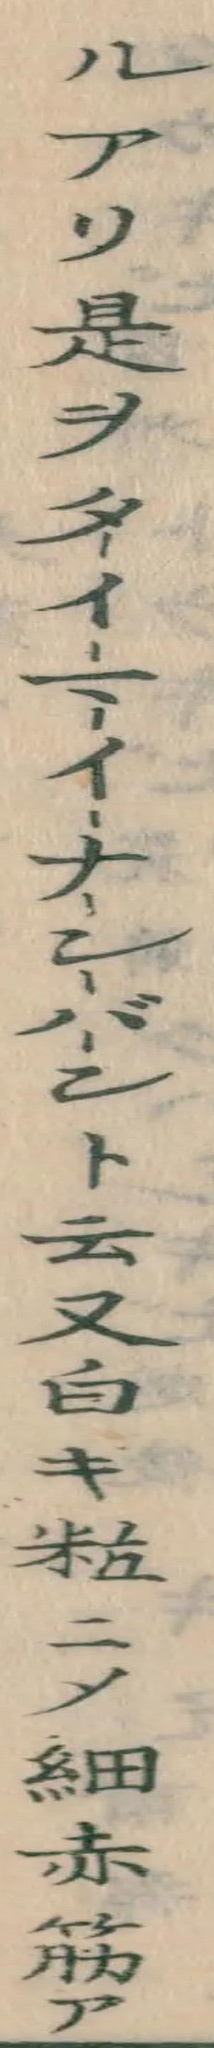ルアリ是ヲタ-イ-マ-イ-ナ-ン-バ-ント云又白キ粒ニシテ細赤筋ア
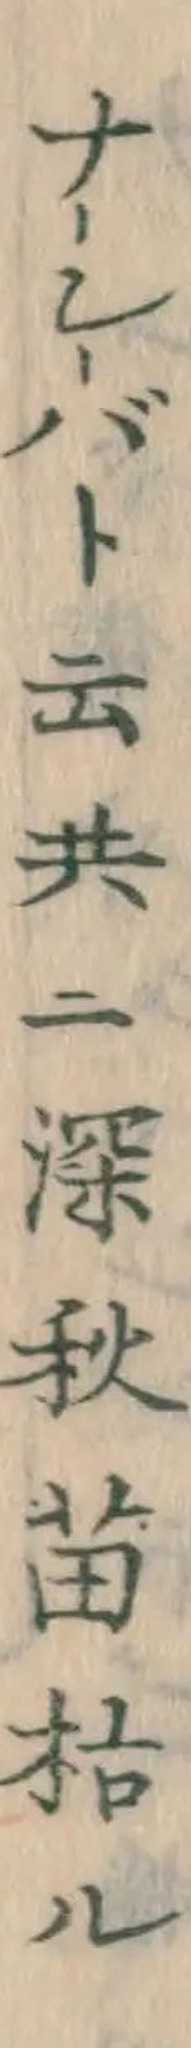ナ-ン-バト云共ニ深秋苗枯ル
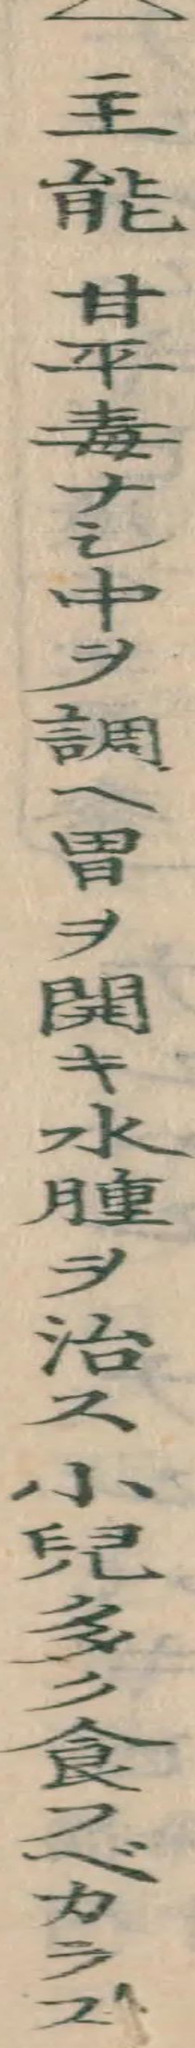△主能甘平毒ナシ中ヲ調ヘ胃ヲ開キ水腫ヲ治ス小児多ク食フベカラス

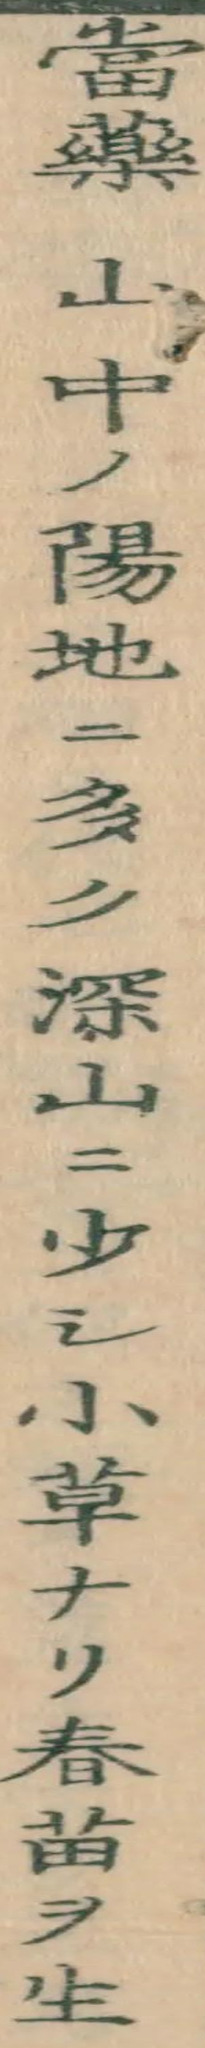当薬山中ノ陽地ニ多ク深山ニ少シ小草ナリ春苗ヲ生
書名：これこれ草 2巻. [2]
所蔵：国立国会図書館 National Diet Library, JAPAN
